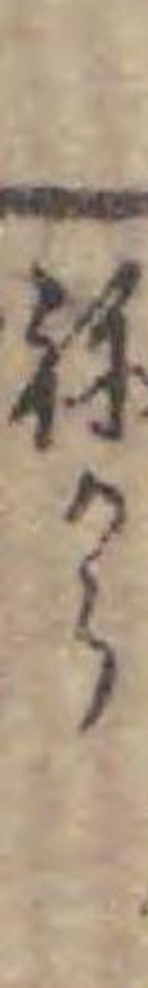ねから
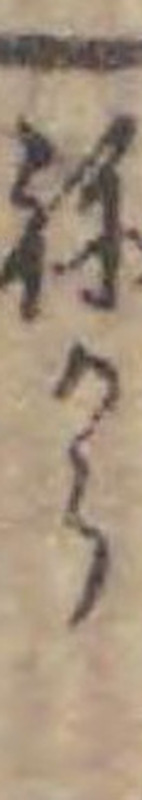ねから
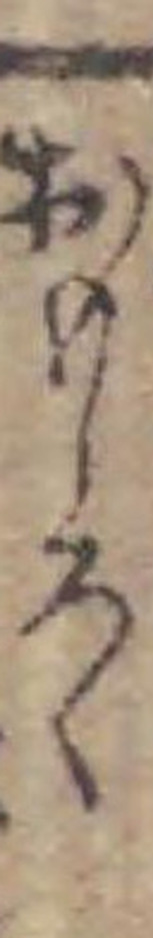おもしろく
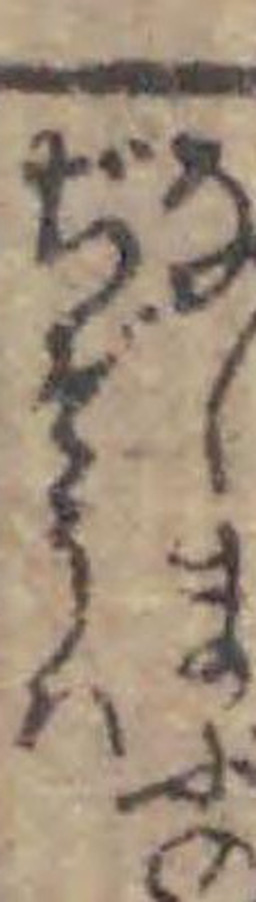ぢぞうは
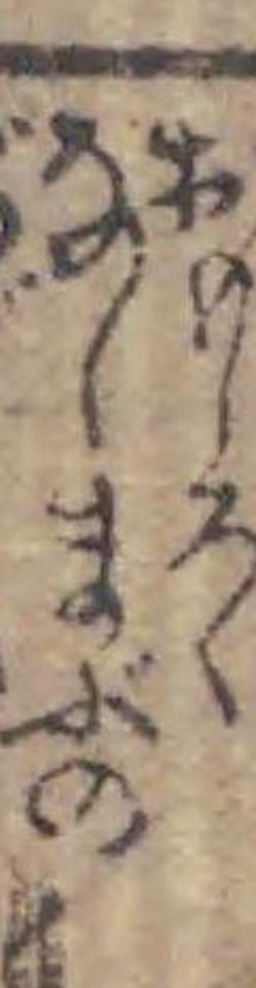なしまぶの
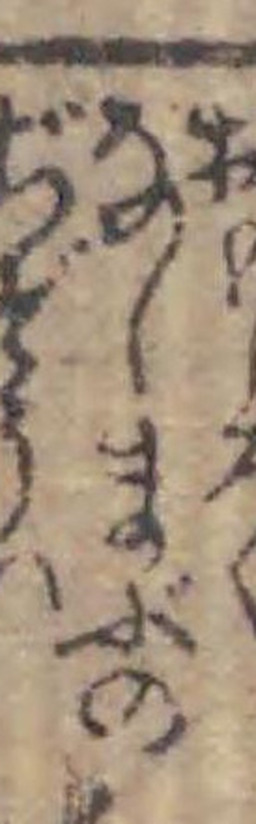ぢぞうは
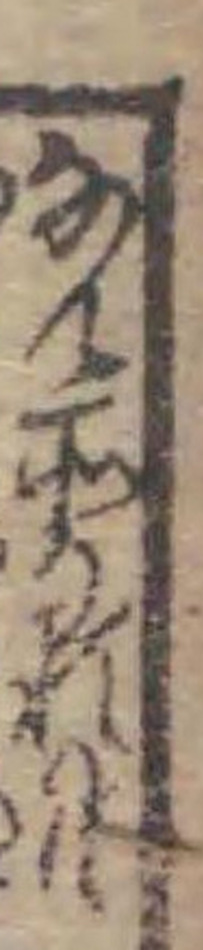なん所なれ共
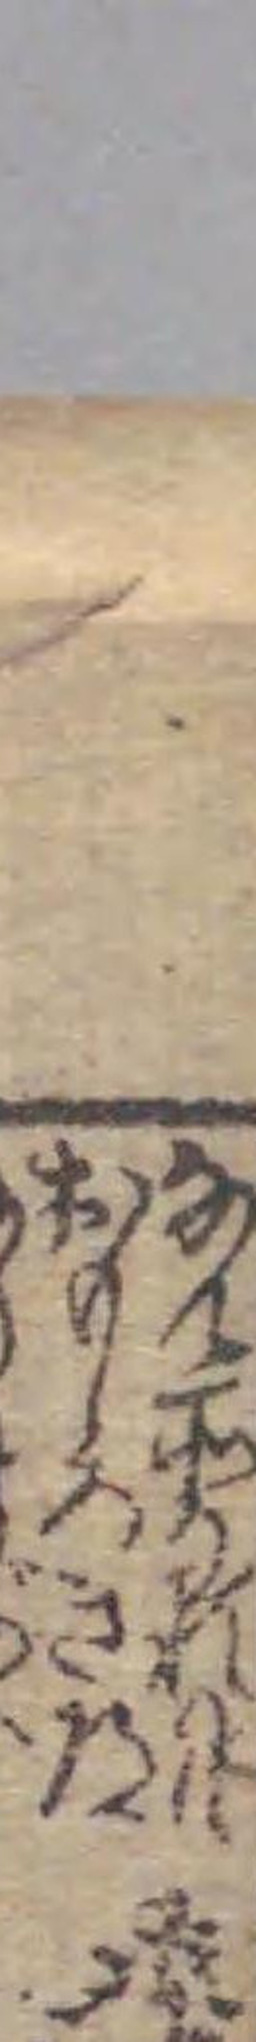おもしろき道
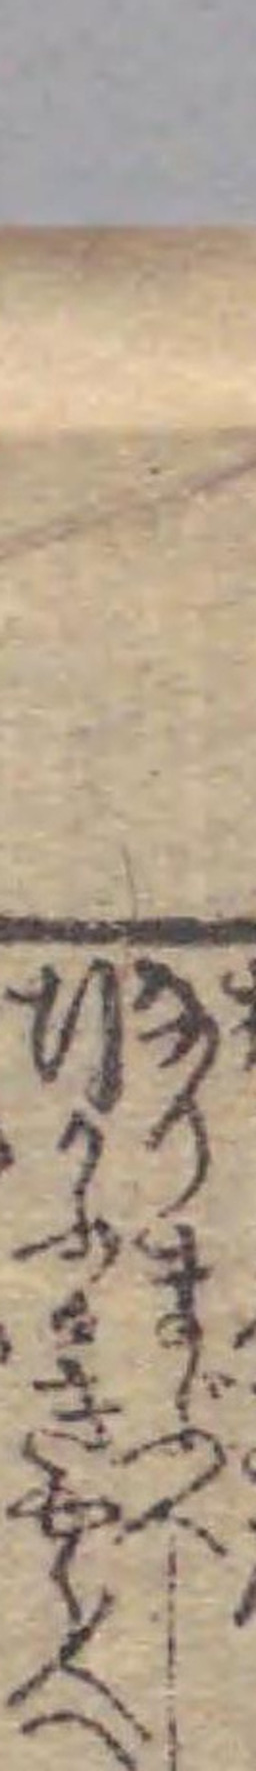行かふかきやく人へ
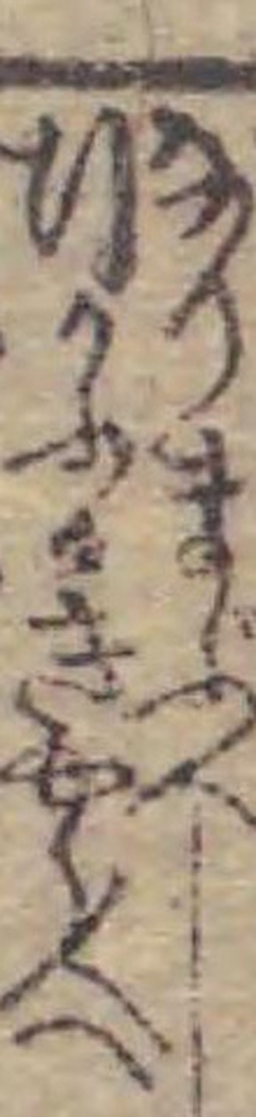行かふかきやく人へ
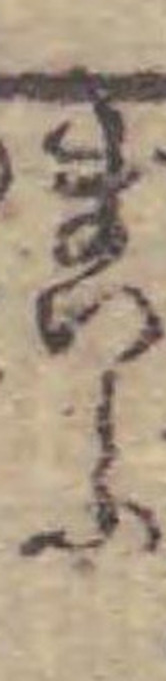まいらふ
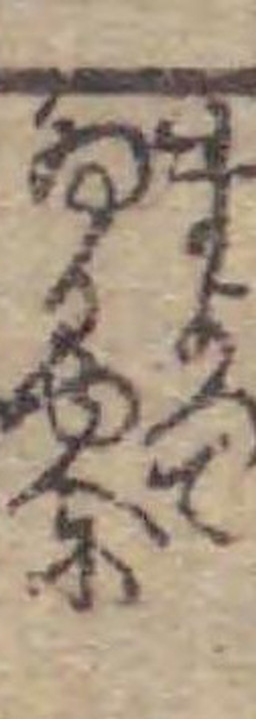ゐるゆへに
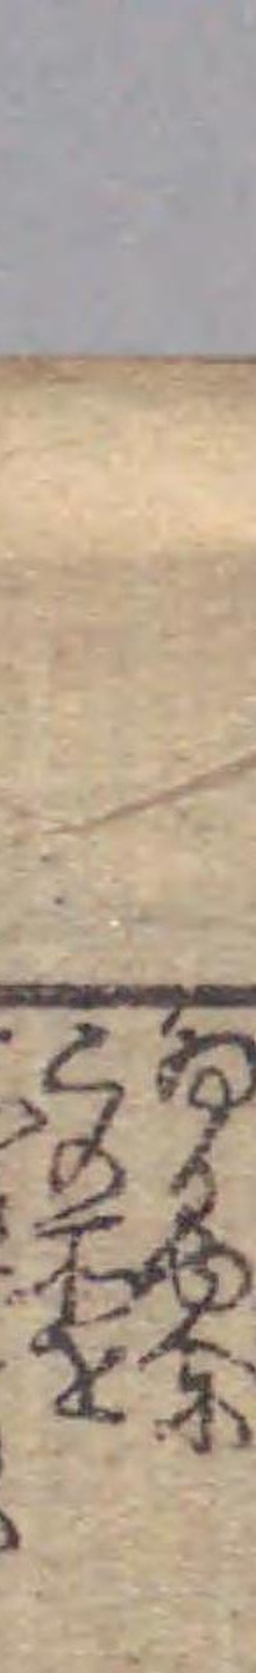この所を
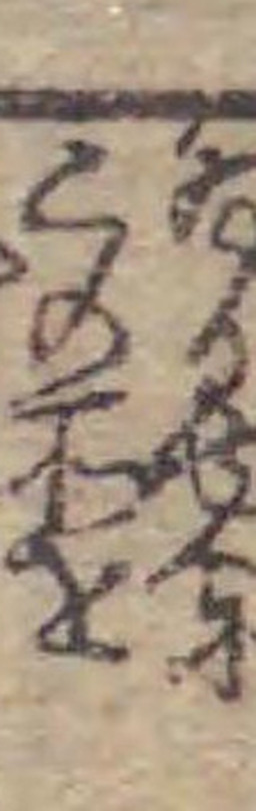この所を
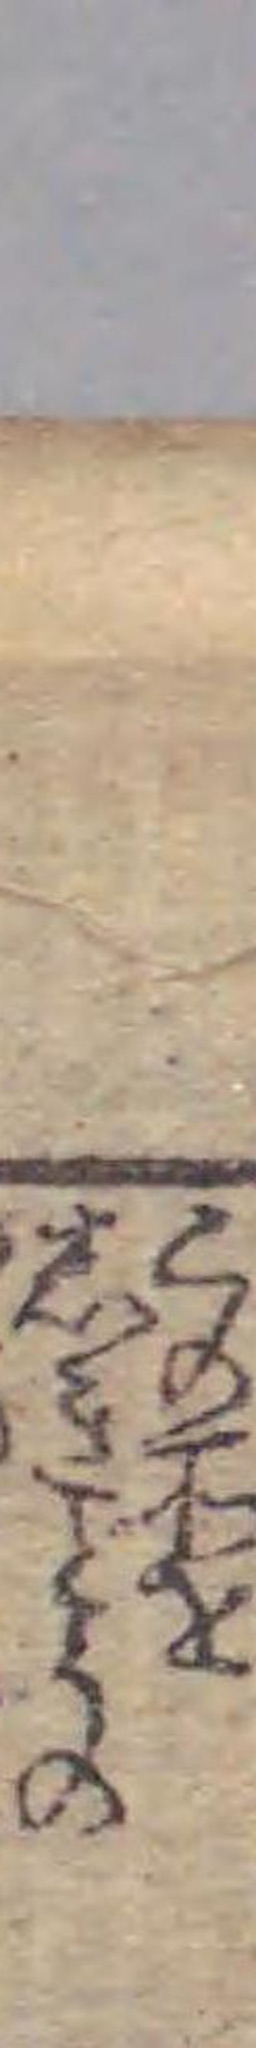しきどうの
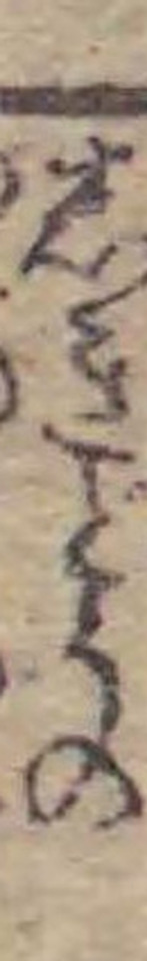しきどうの
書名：北国順礼唄方便 : 3巻
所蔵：国立国会図書館 National Diet Library, JAPAN
